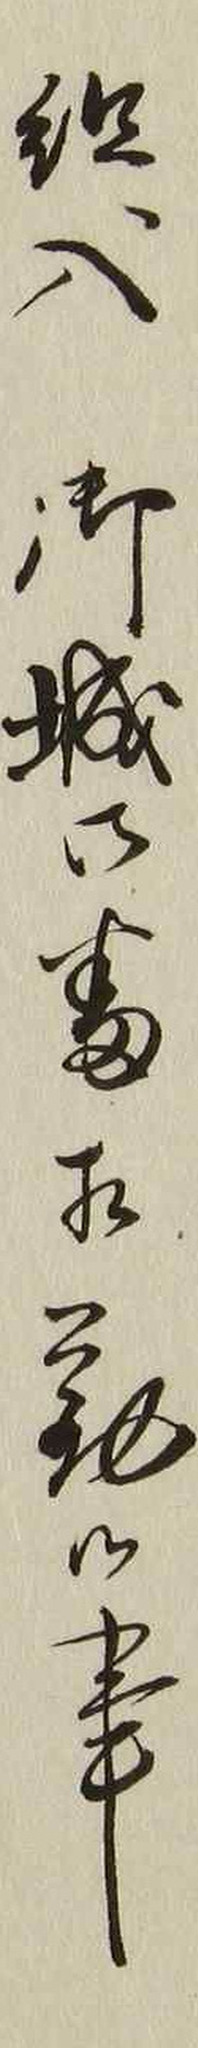組ㇸ入御城御番相勤候事
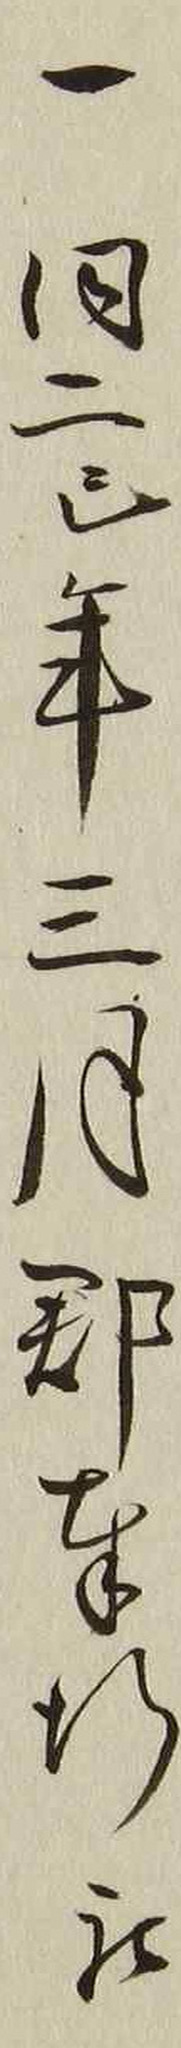一同二巳年三月郡奉行被
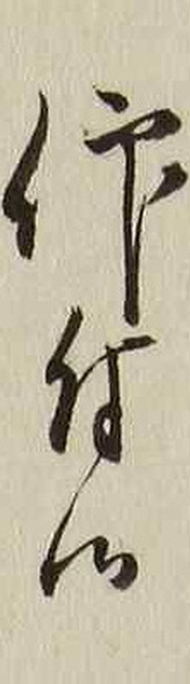仰付候
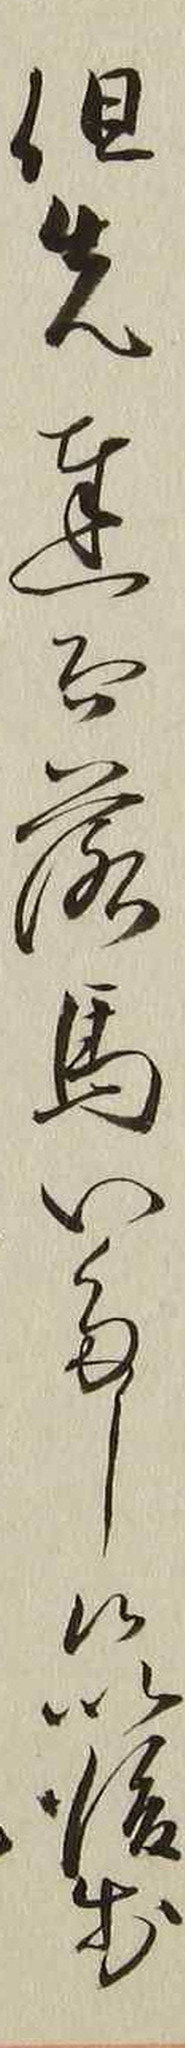但先達而落馬いたし候以後歩
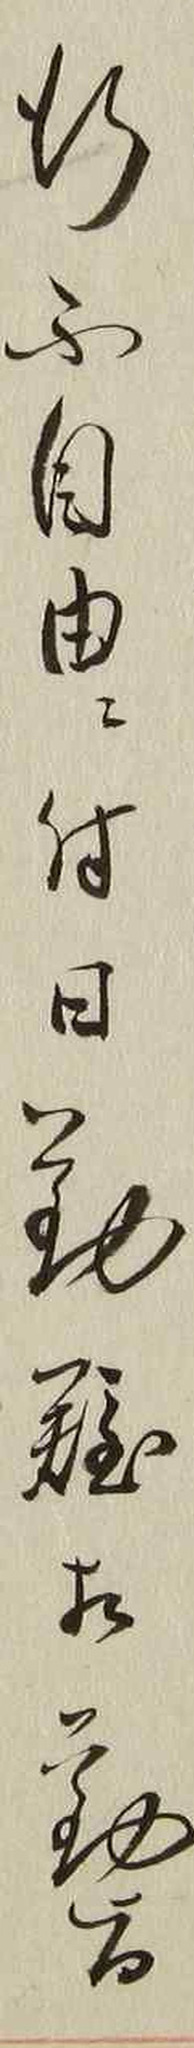行不自由ニ付日勤難相勤旨
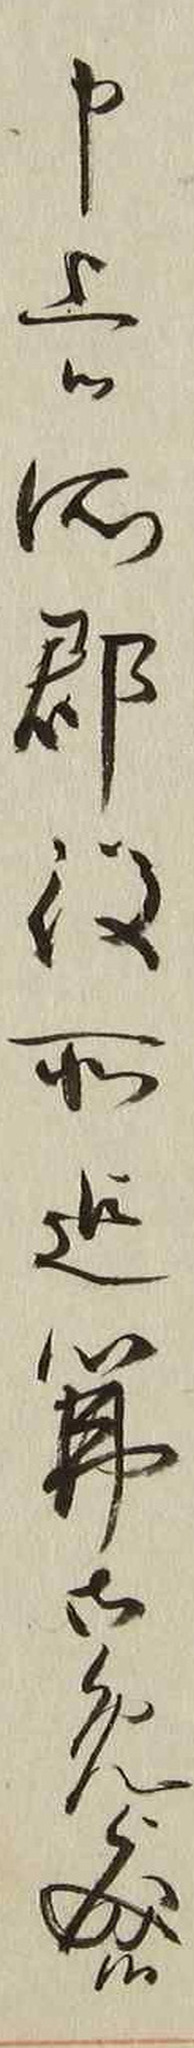申上候所郡役所迄篝御免被成候
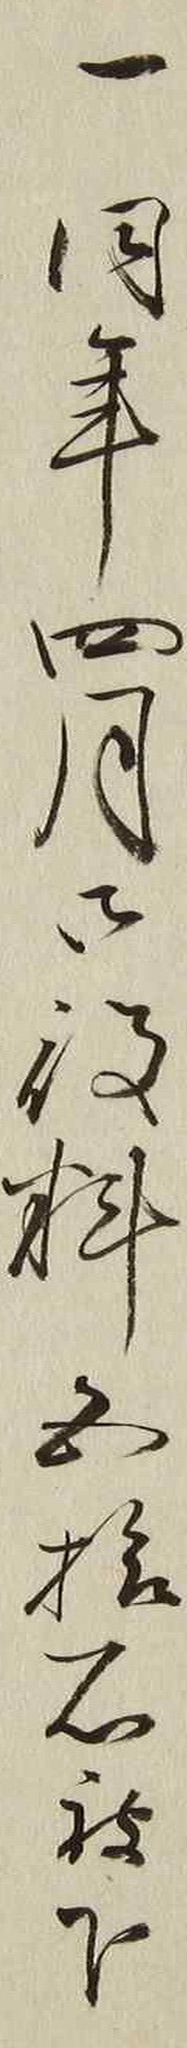一同年四月御役料五拾石被下
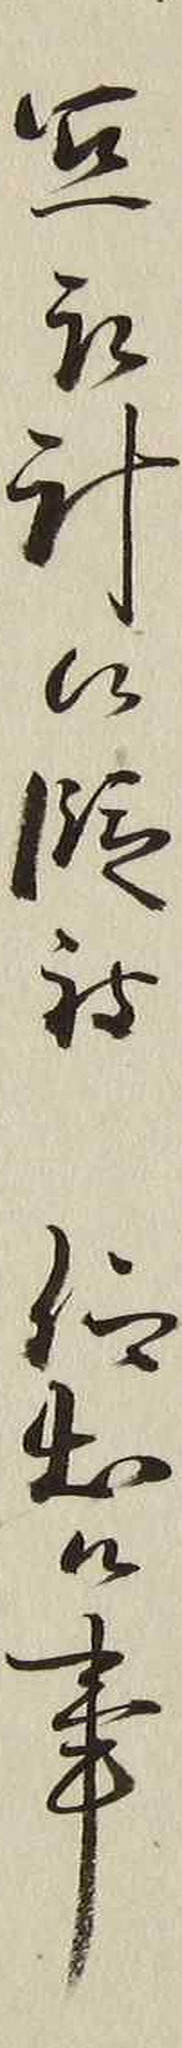宜取計候段被仰出候事
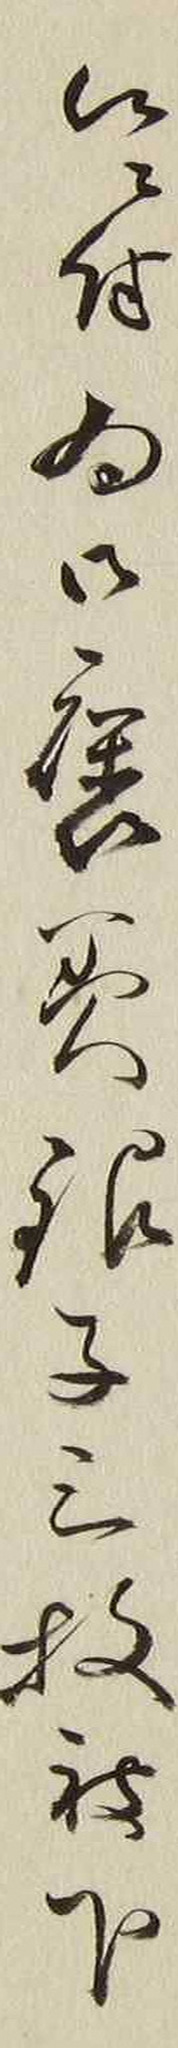候ニ付為御褒美銀子三枚被下
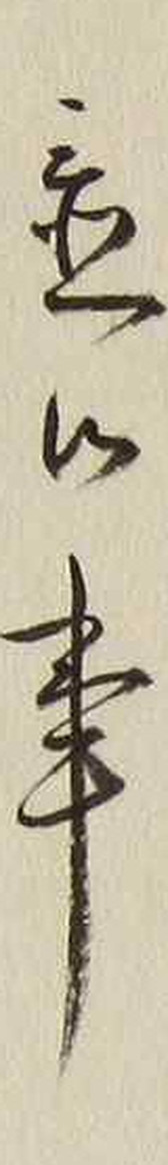置候事
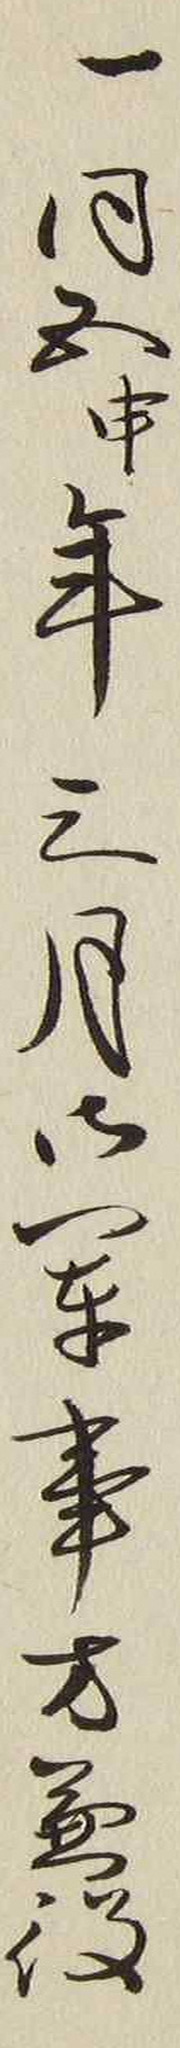一同五申年三月御軍事方兼役
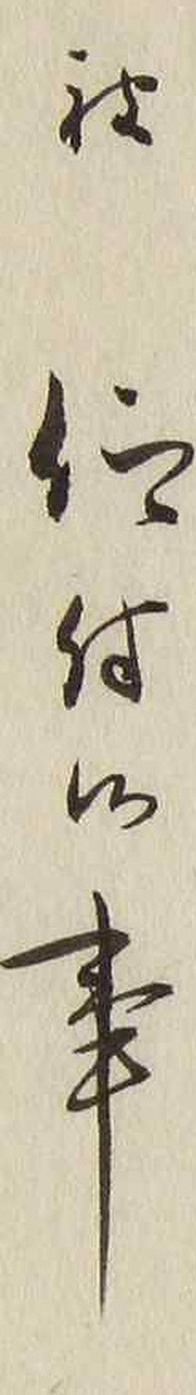被仰付候事

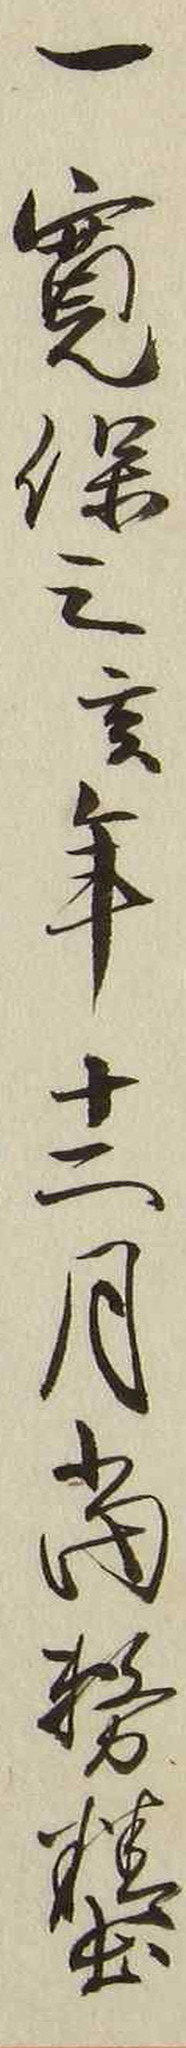一寛保三亥年十二月当務精出
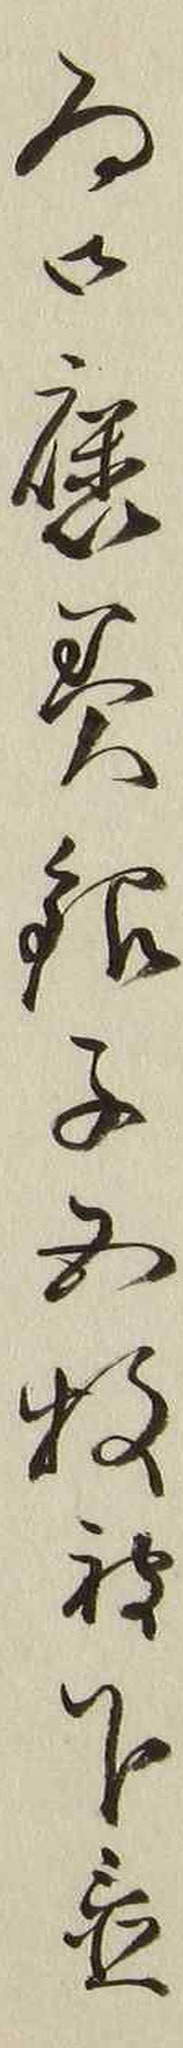為御褒美銀子五枚被下置
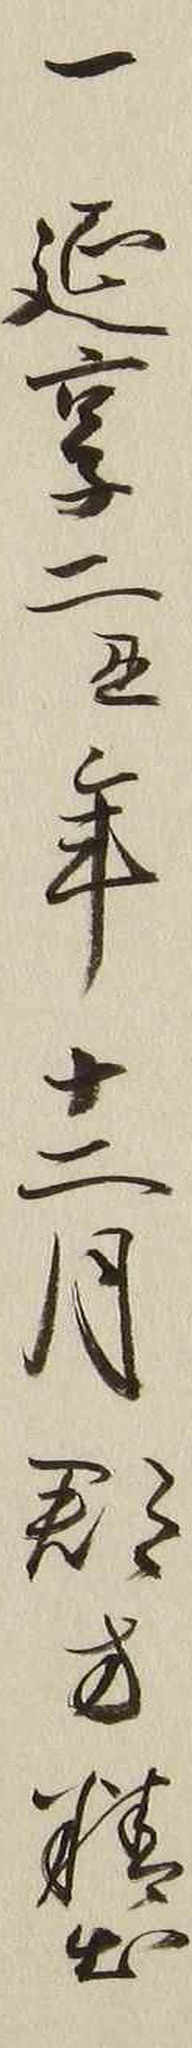一延享二丑年十二月郡方精出
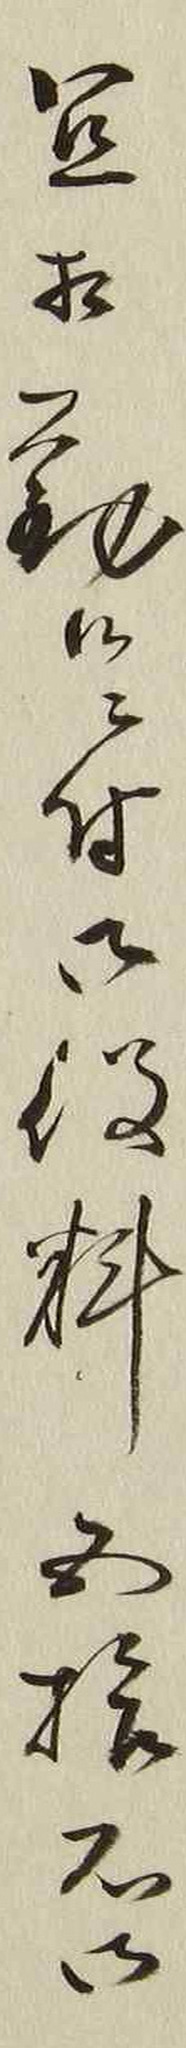宜相勤候ニ付御役料五拾石御
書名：諸士系譜　巻之163　な之部5
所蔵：会津若松市立会津図書館
